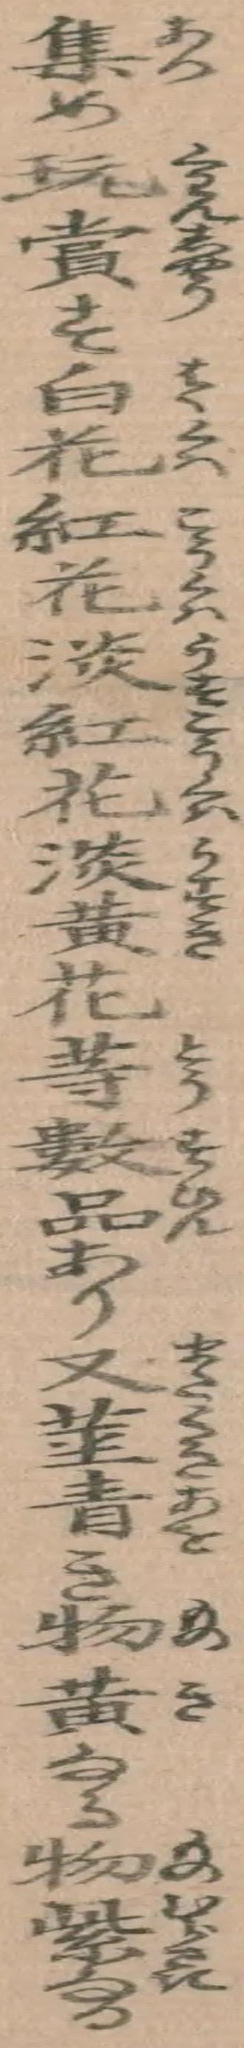集め玩賞す白花紅花淡紅花淡黄花等数品あり又茎青き物黄なる物紫なる
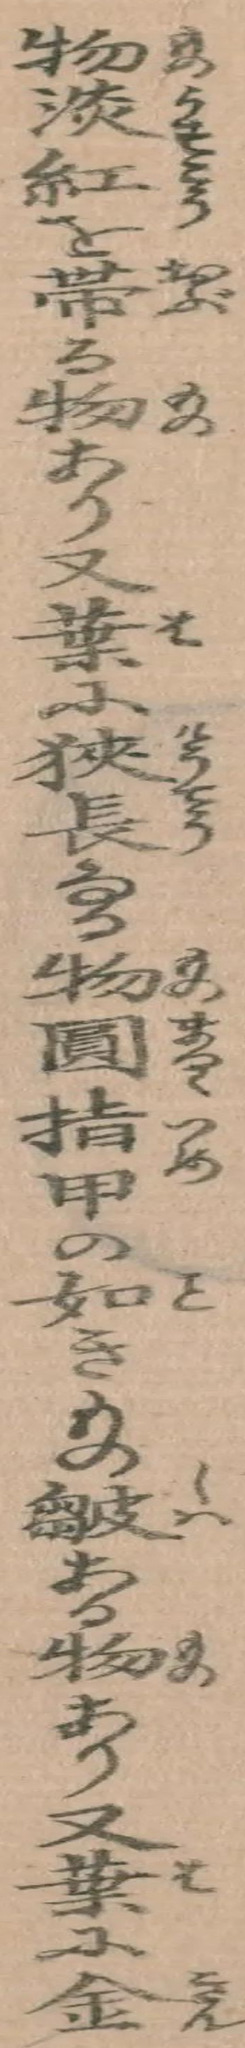物淡紅を帯る物あり又葉に狭長なる物円指甲の如きもの皺ある物あり又葉に金
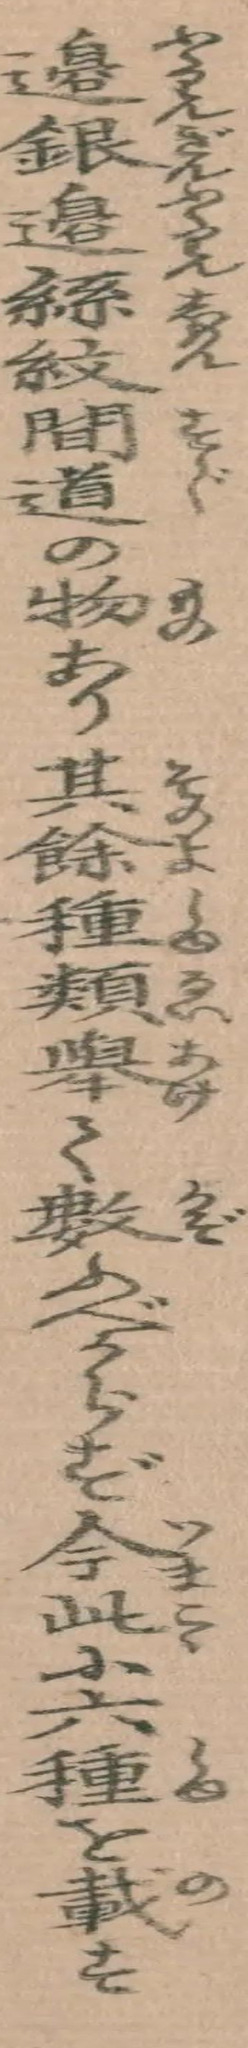辺銀辺糸紋間道の物あり其余種類挙て数ふべからず今此に六種を載す

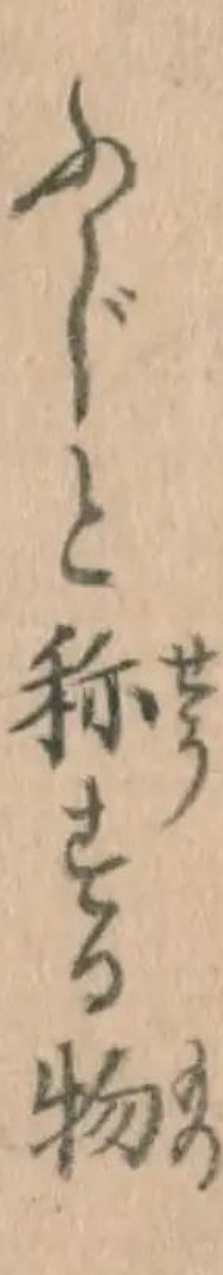ふじと称する物
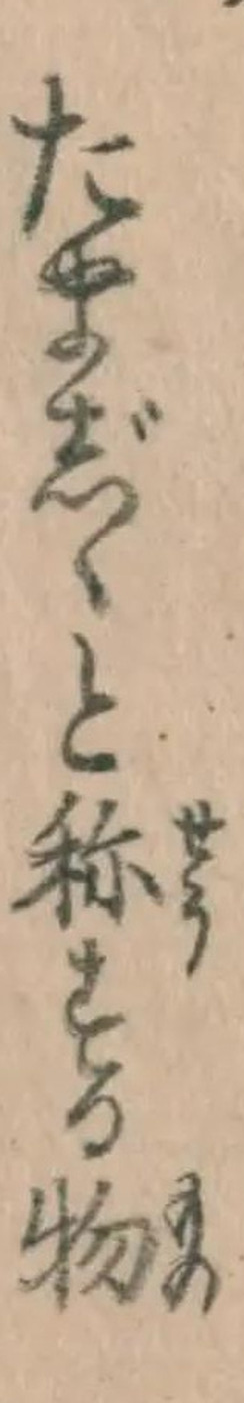たまじゝと称する物
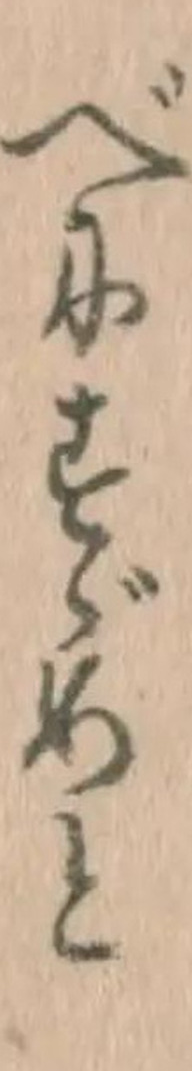べにすゞめと
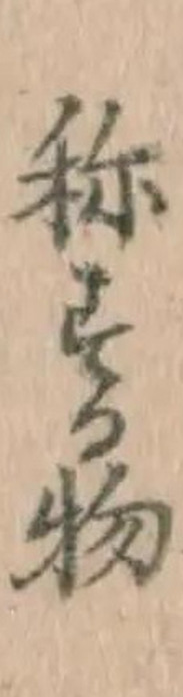称する物
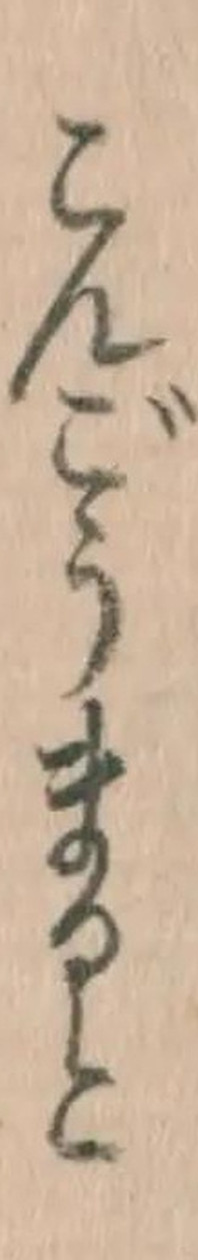こんごうまると
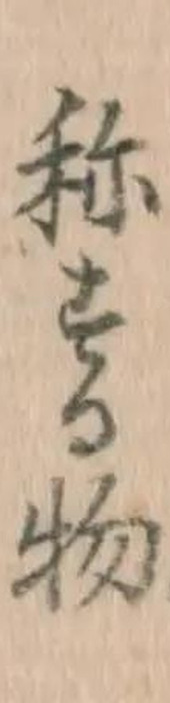称する物
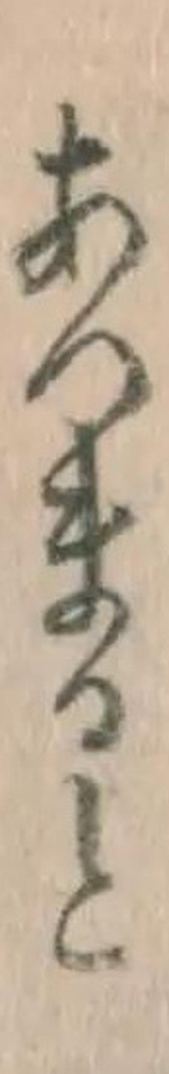あつまると
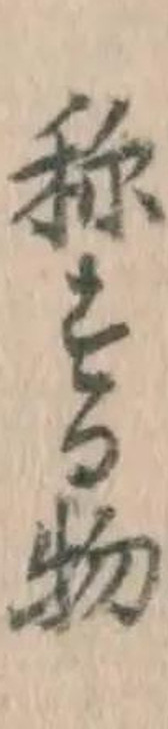称する物

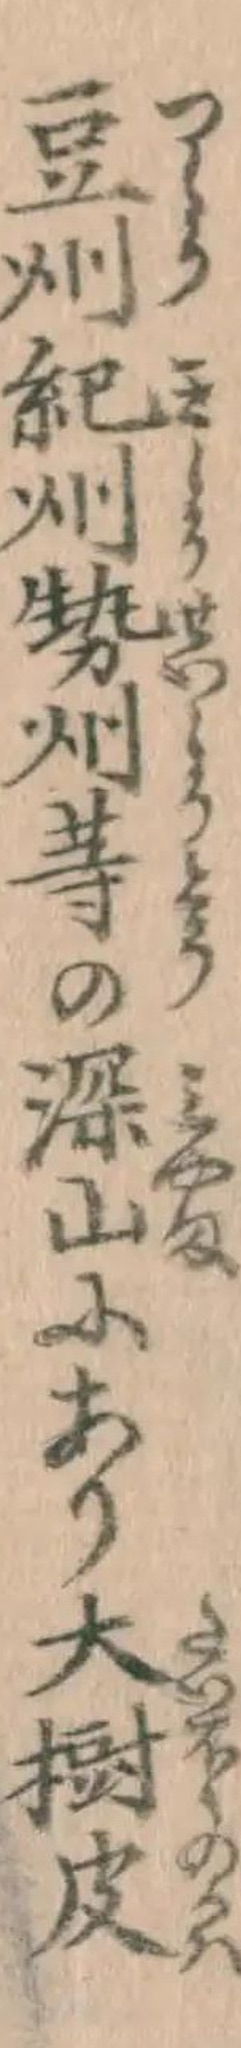豆州紀州勢州等の深山にあり大樹皮
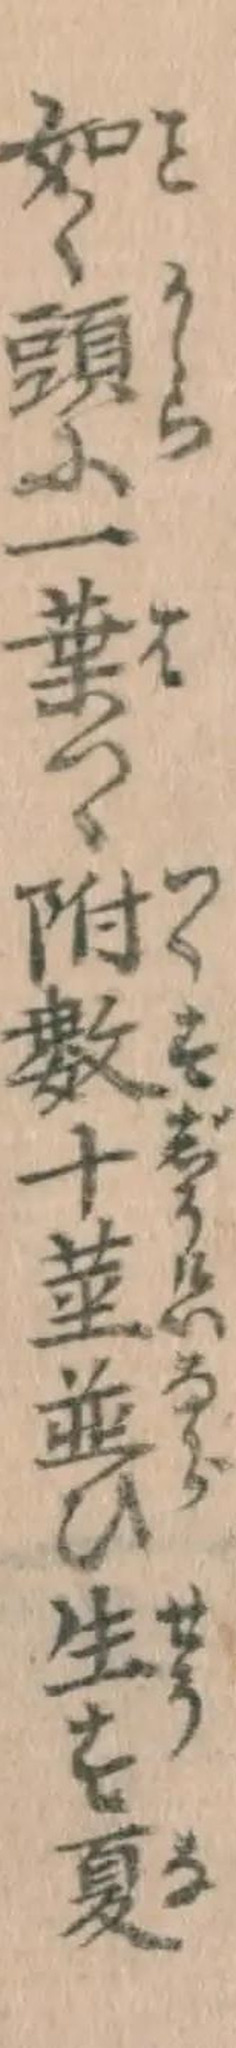如く頭に一葉つゝ附数十茎並ひ生す夏
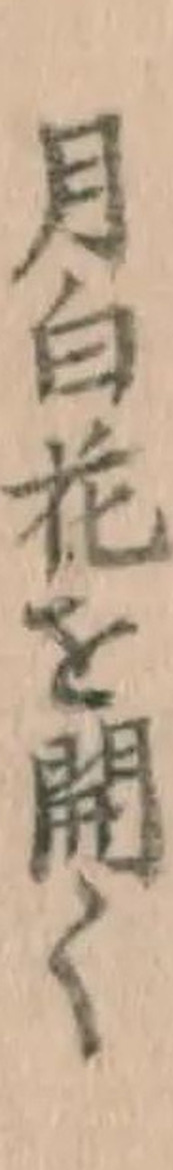月白花を開く
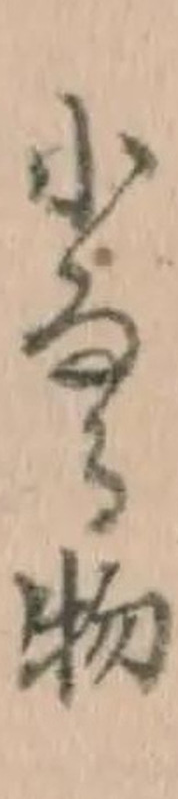小なる物
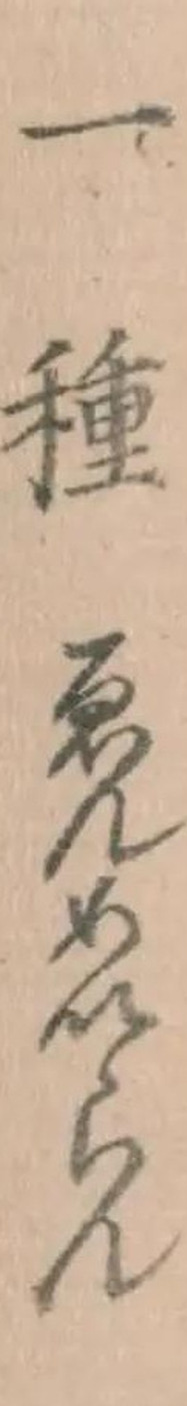一種ゑんめいらん
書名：本草図譜. 巻34-36
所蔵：国立国会図書館 National Diet Library, JAPAN
